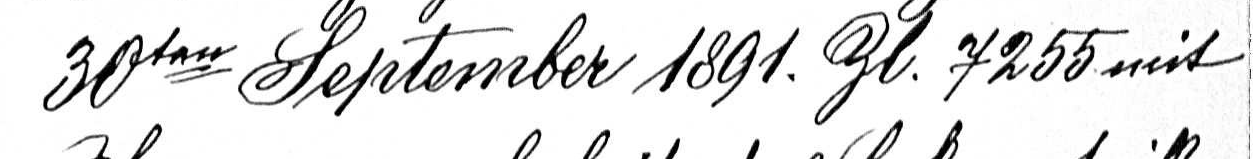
30ten September 1891 Zl 7255 mit
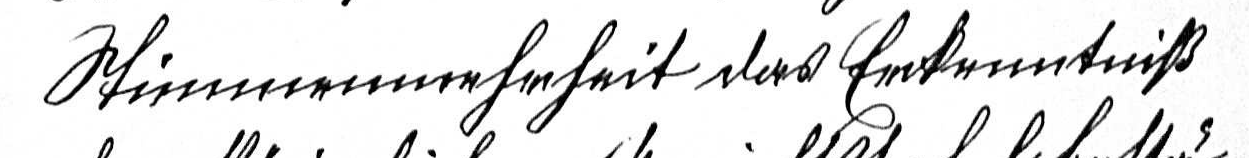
Stimmenmehrheit das Erkenntniß
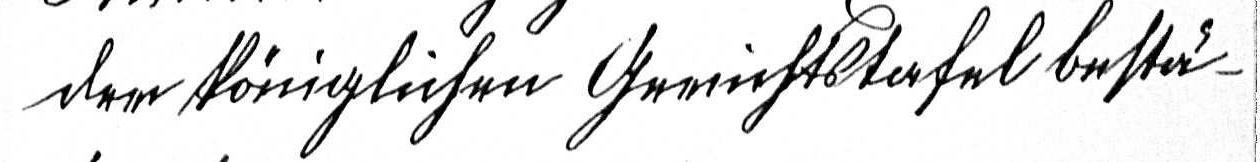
der königlichen Gerichtstafel bestä¬
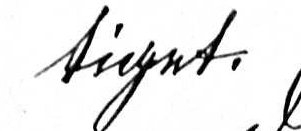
tigt.
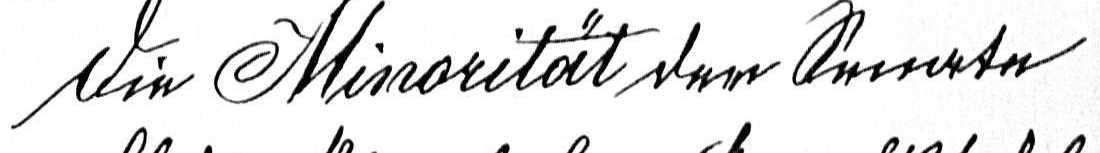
Die Minorität der Senate
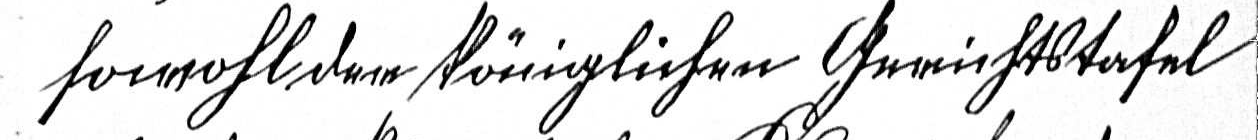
sowohl der königlichen Gerichtstafel
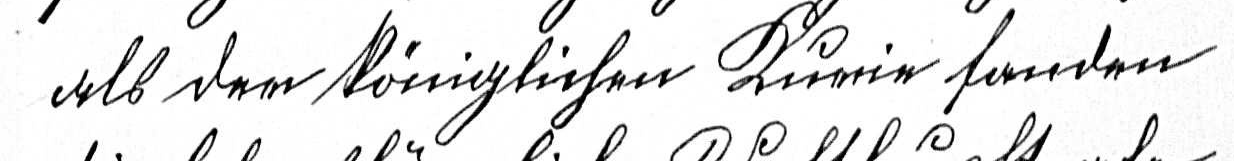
als der königlichen Kurie fanden
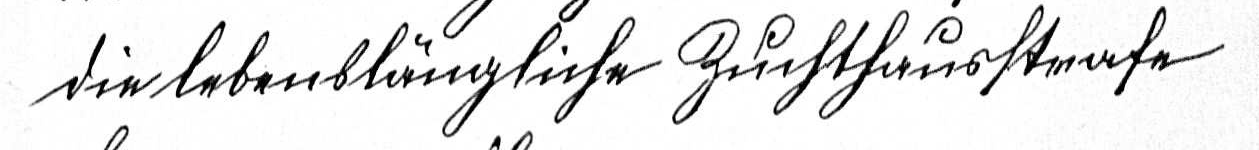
die lebenslängliche Zuchthausstrafe
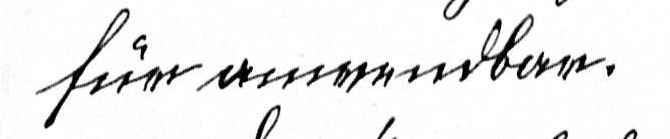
für anwendbar.
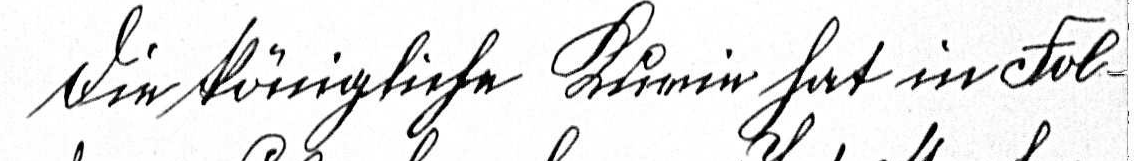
Die königliche Kurie hat in Fol¬
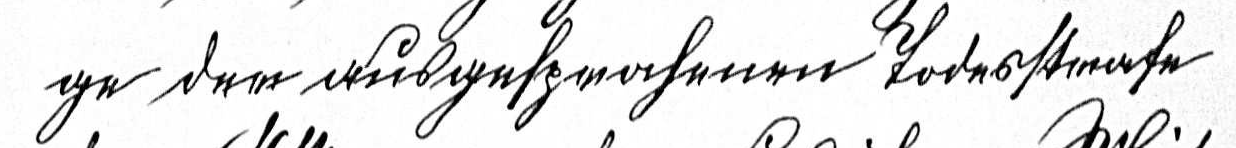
ge der ausgesprochenen Todesstrafe
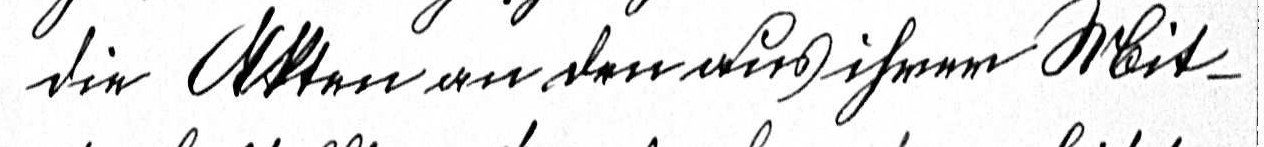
die Akten an den aus ihrer Mit¬
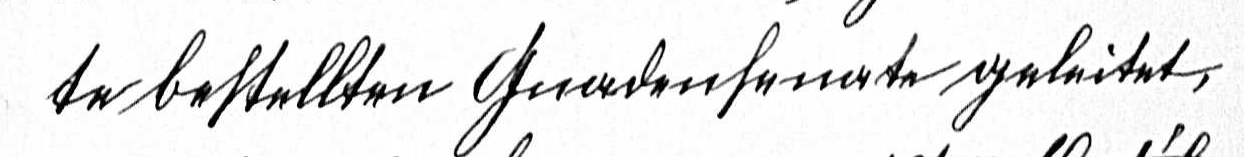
te bestellten Gnadensenate geleitet,
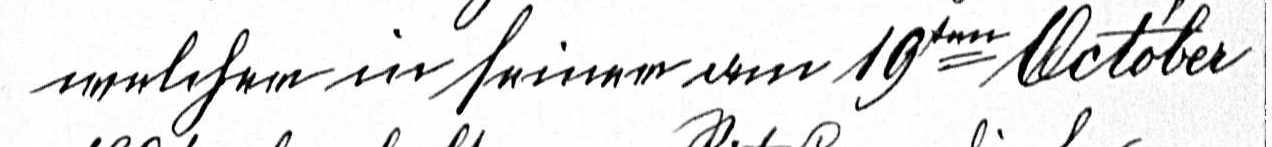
welcher in seiner am 19ten October
